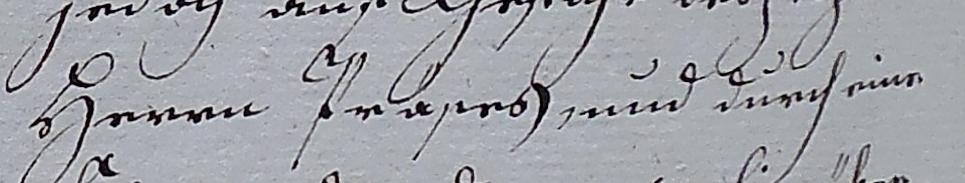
Herrn Präses, und durch eine
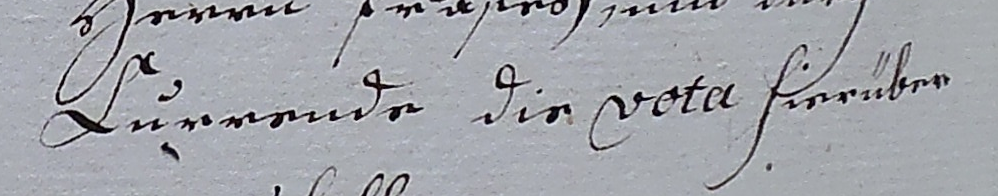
Currende die vota hierüber
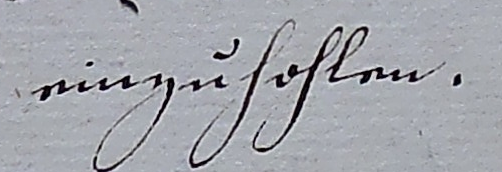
einzuhohlen.
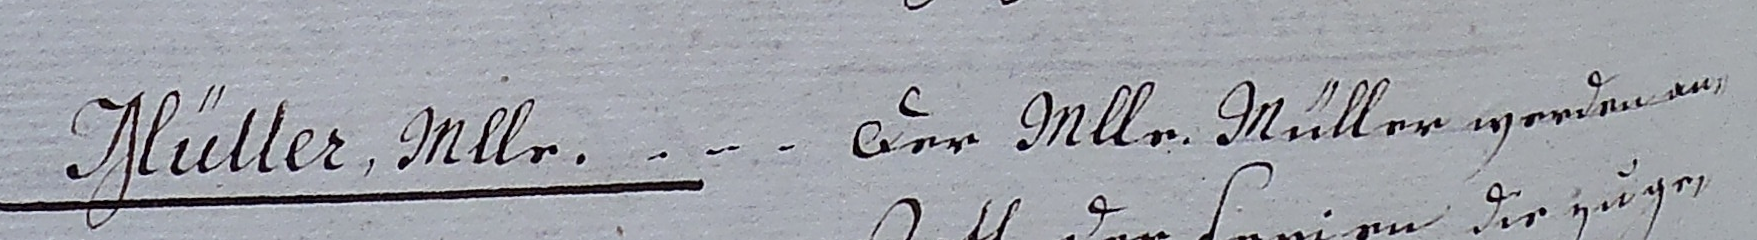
Müller, Mlle. .. .. .. Der Mlle. Müller werden an
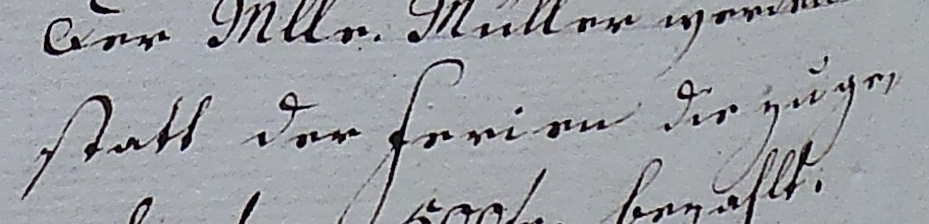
statt der Ferien die zu ge¬
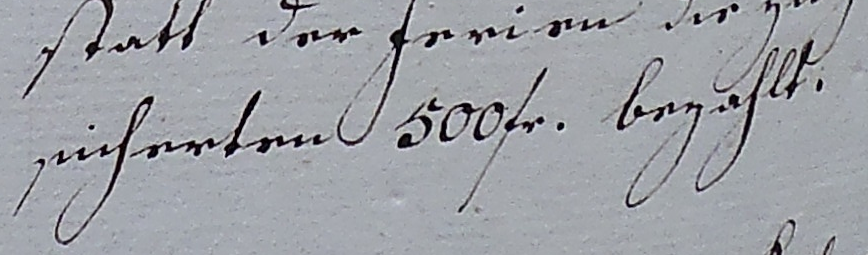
sicherten. 500fr. bezahlt.
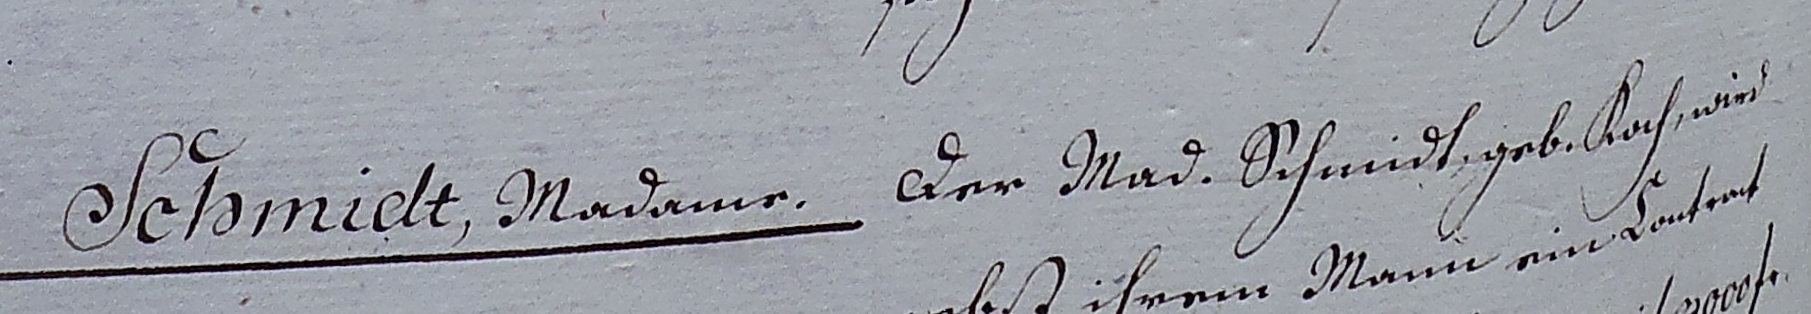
Schmidt, Madame. Der Mad: Schmidt, geb. Koch, wird
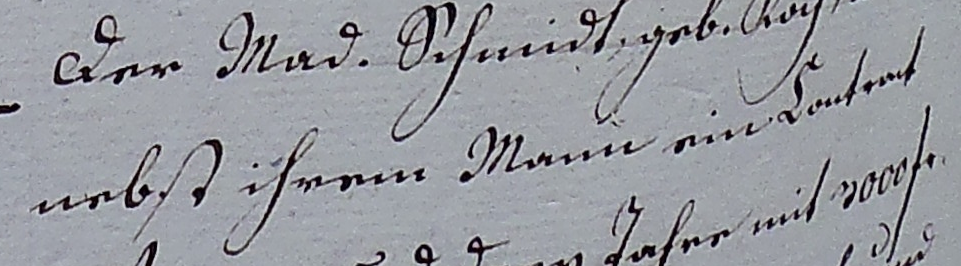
nebst ihrem Mann ein Contract
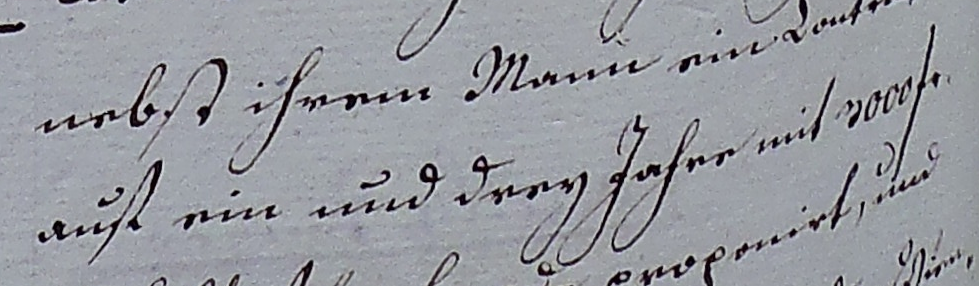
auf ein und drey Jahre mit 3000fr.
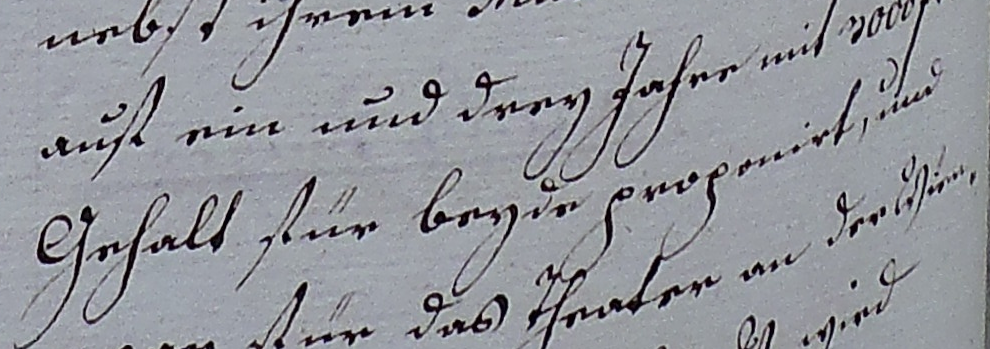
Gehalt für beyde proponirt, und
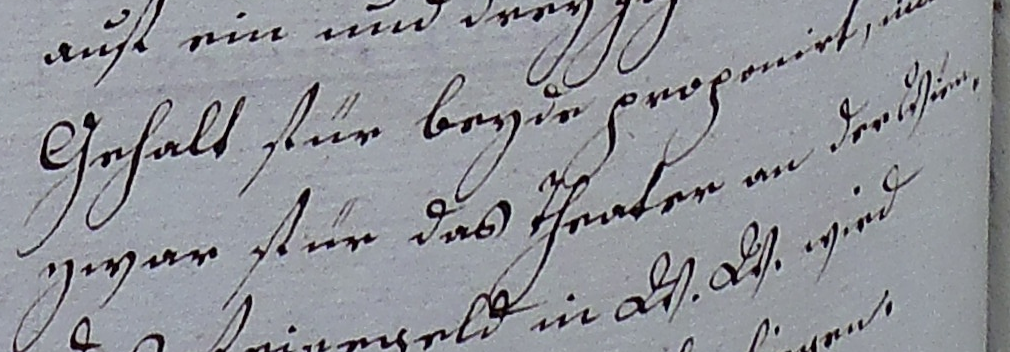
zwar für das Theater an der Wien,
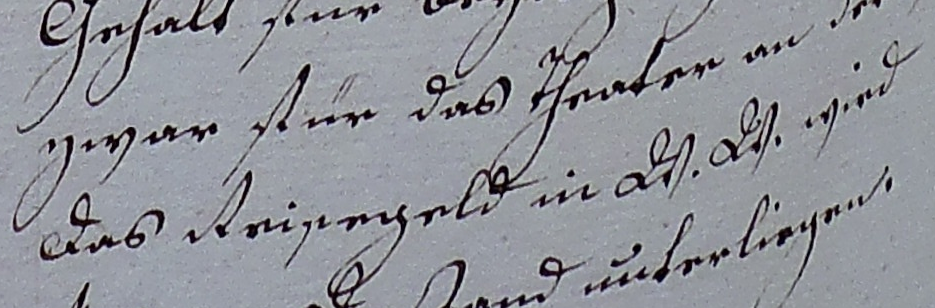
das Reisegeld in W.W. wird
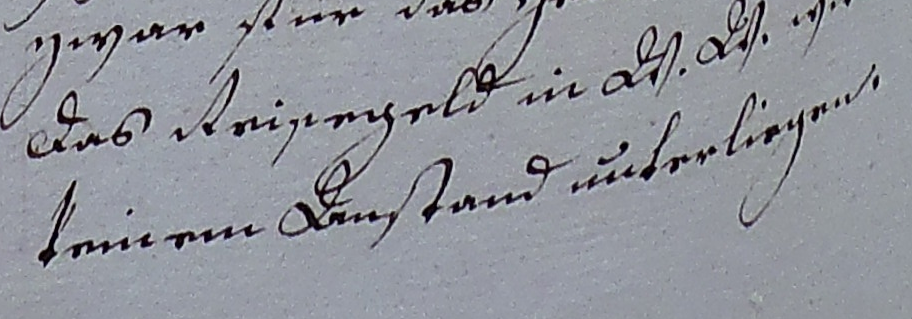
keinem Anstand unterliegen.
